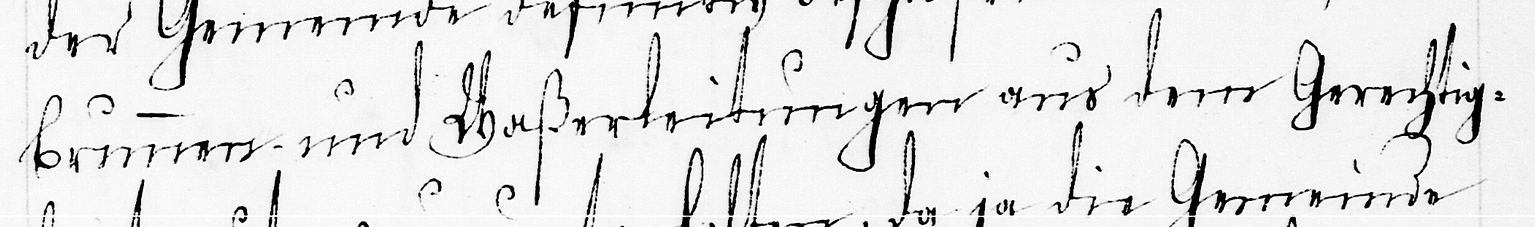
Brunnen- und Waßerleitungen aus dem Gerechtig¬
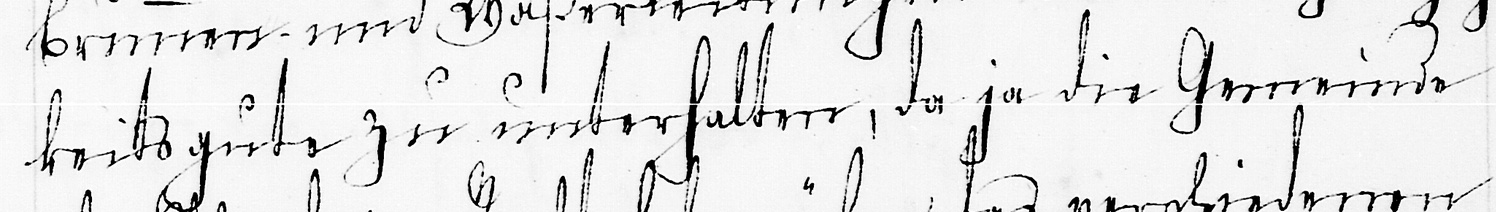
keitsgute zu unterhalten, da ja die Gemeinde
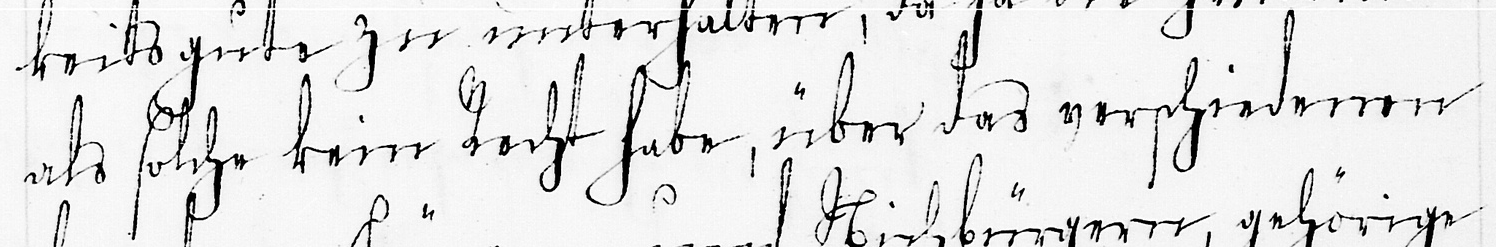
als solche kein Recht habe, über das verschiedenen
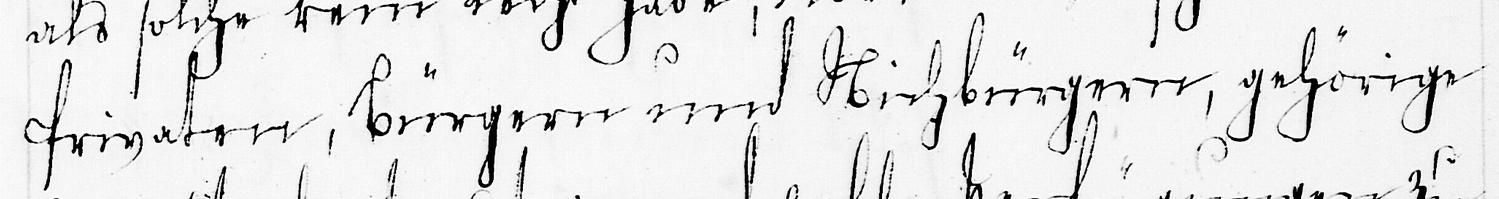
Privaten, Bürgern und Nichbürgern [sic!], gehörige
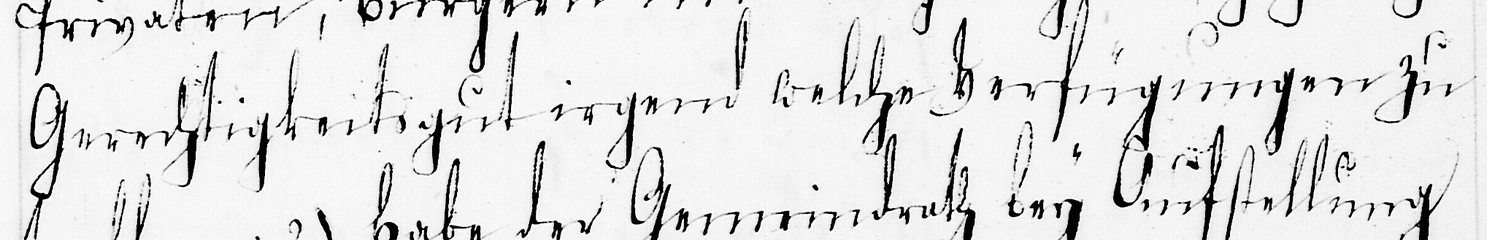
Gerechtigkeitsgut irgend welche Verfügungen zu
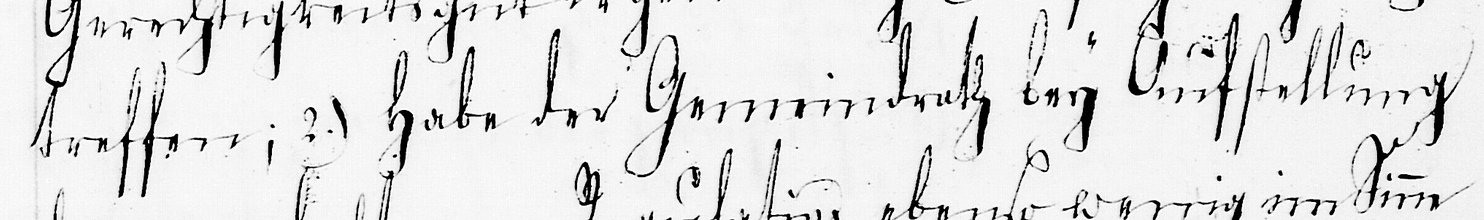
treffen; 2.) Habe der Gemeindrath bey Aufstellung
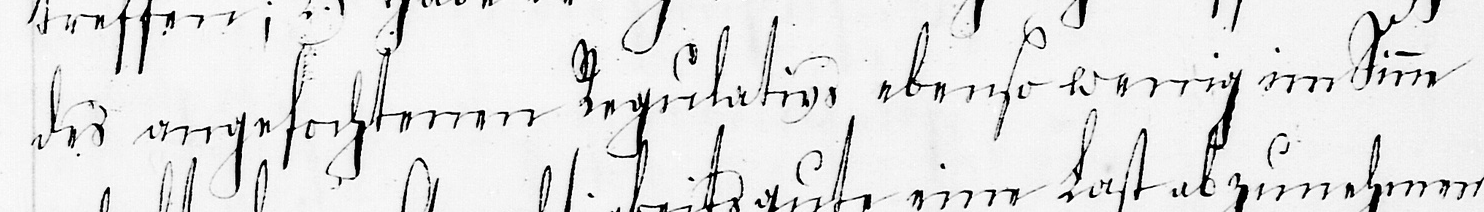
des angefochtenen Regulativs ebenso wenig im Sinne
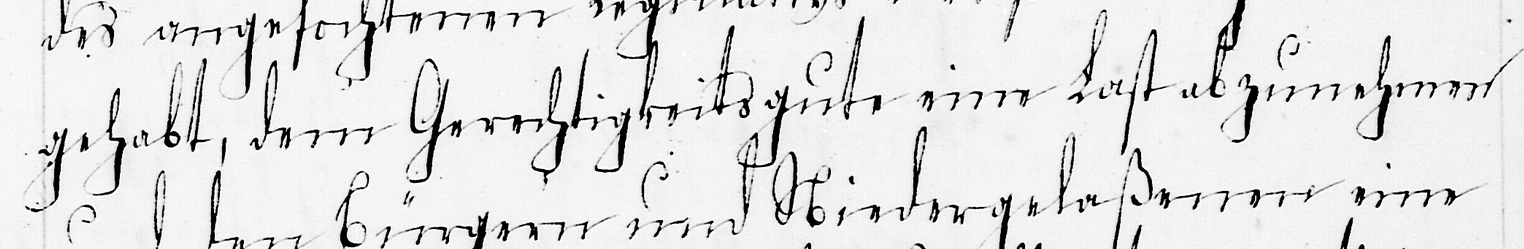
gehabt, dem Gerechtigkeitsgute eine Last abzunehmen
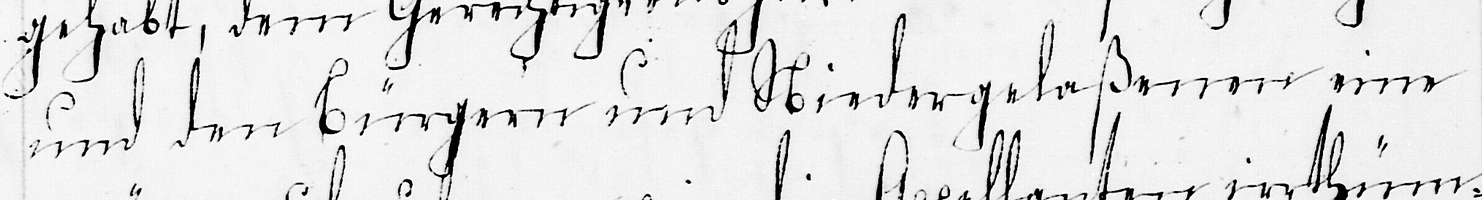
und den Bürgern und Niedergelaßenen eine
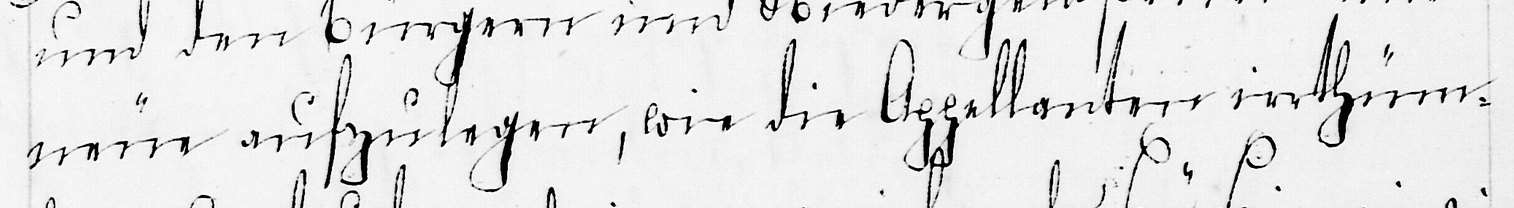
neue aufzulegen, wie die Appellanten irrthüm¬
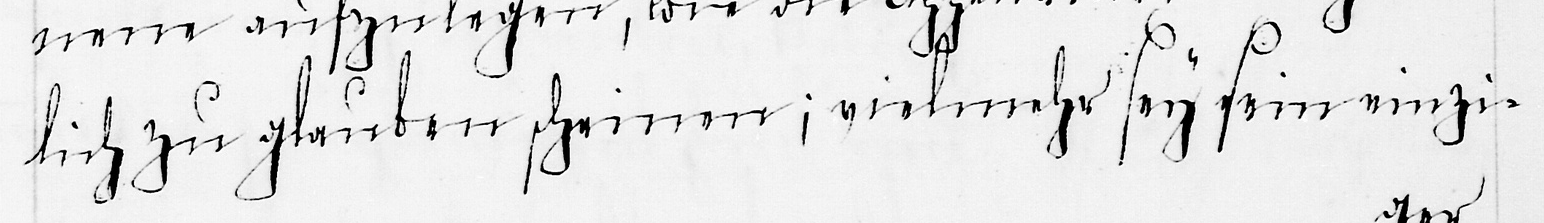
lich zu glauben scheinen; vielmehr sey sein einzi-
